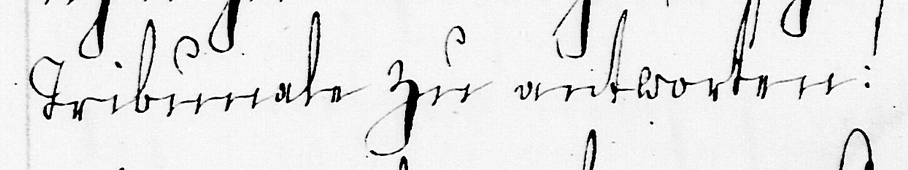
Tribunale zu antworten:
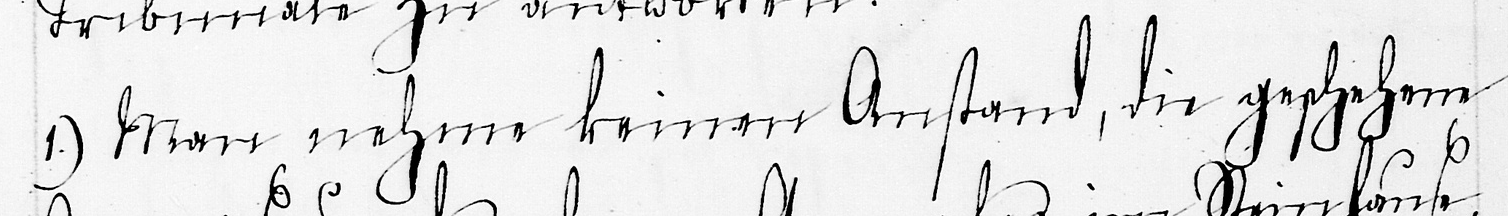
1.) Man nehme keinen Anstand, die geschehene
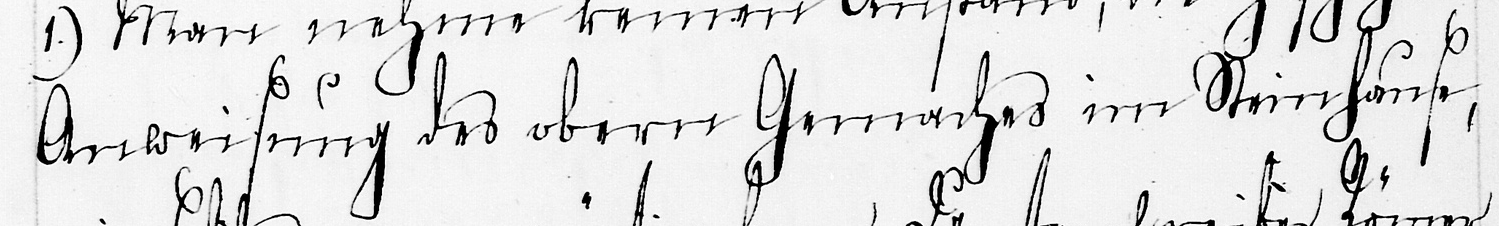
Anweisung des obern Gemaches im Steinhause,
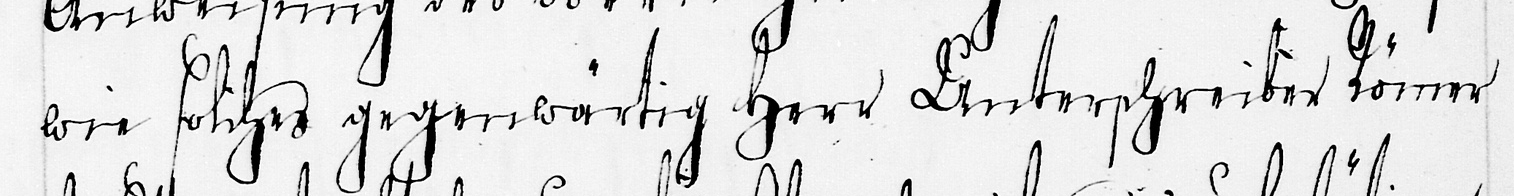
wie solches gegenwärtig Herr Unterschreiber Römer
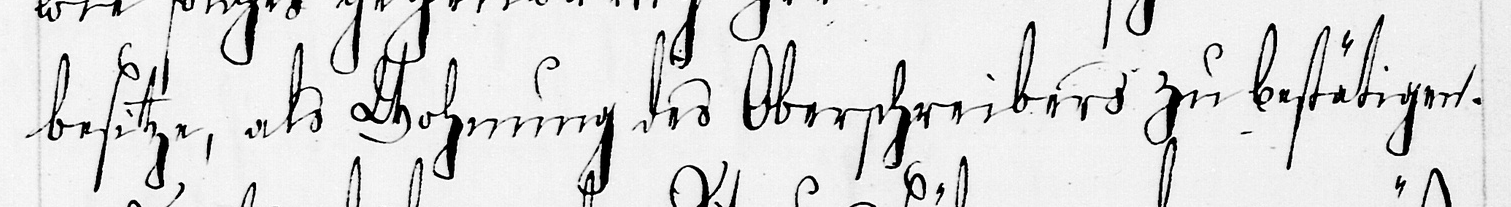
besitze, als Wohnung des Oberschreibers zu bestätigen.
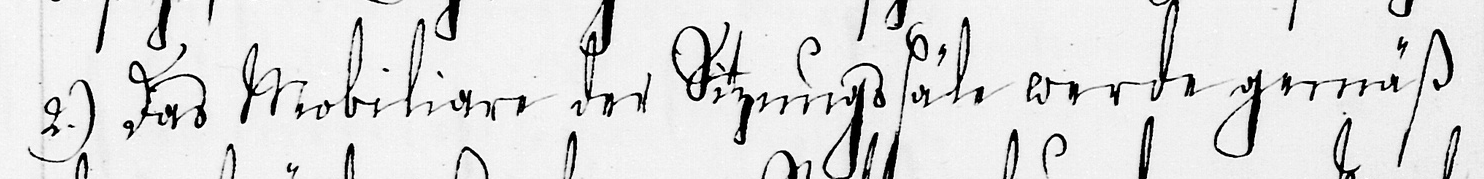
2.) Das Mobiliare der Sitzungssäle werde gemäß
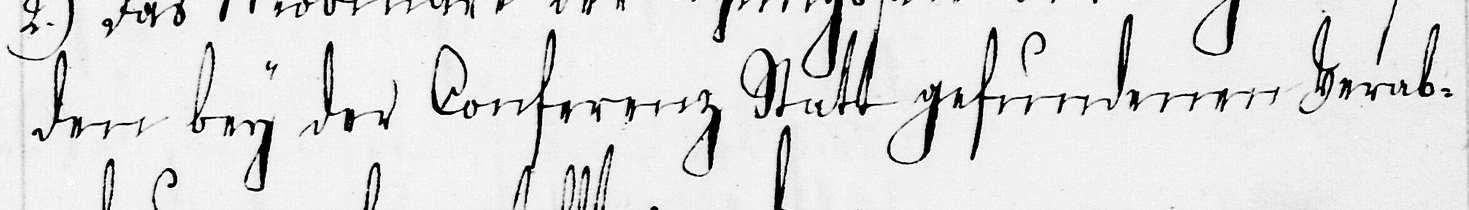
den bey der Conferenz Statt gefundenen Verab¬
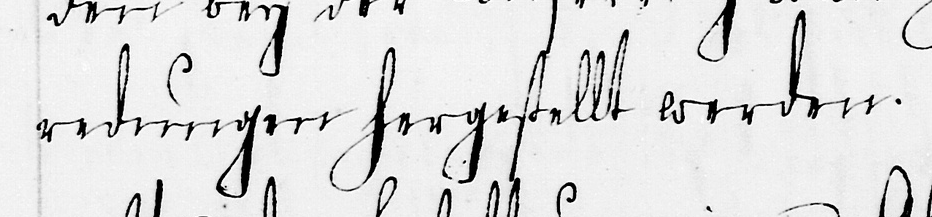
redungen hergestellt werden.
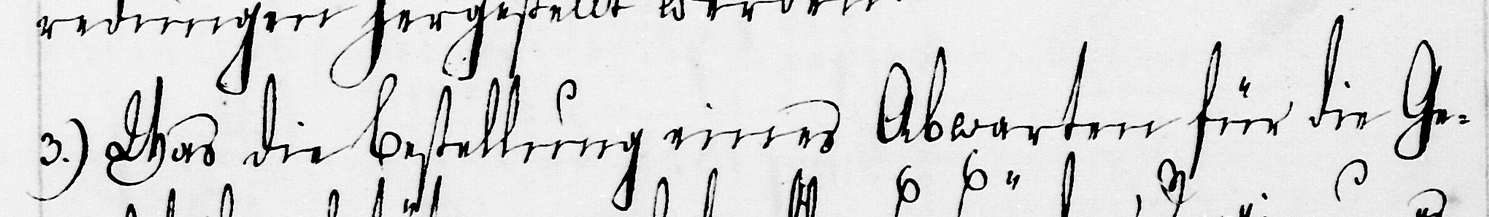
3.) Was die Bestellung eines Abwarten für die Ge¬
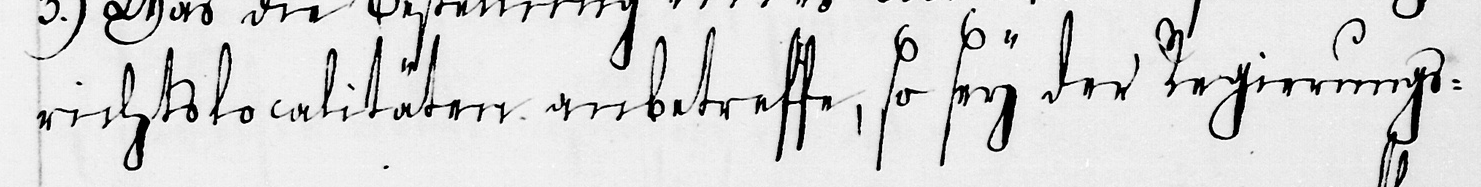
richtslocalitäten anbetreffe, so sey der Regierungs-
